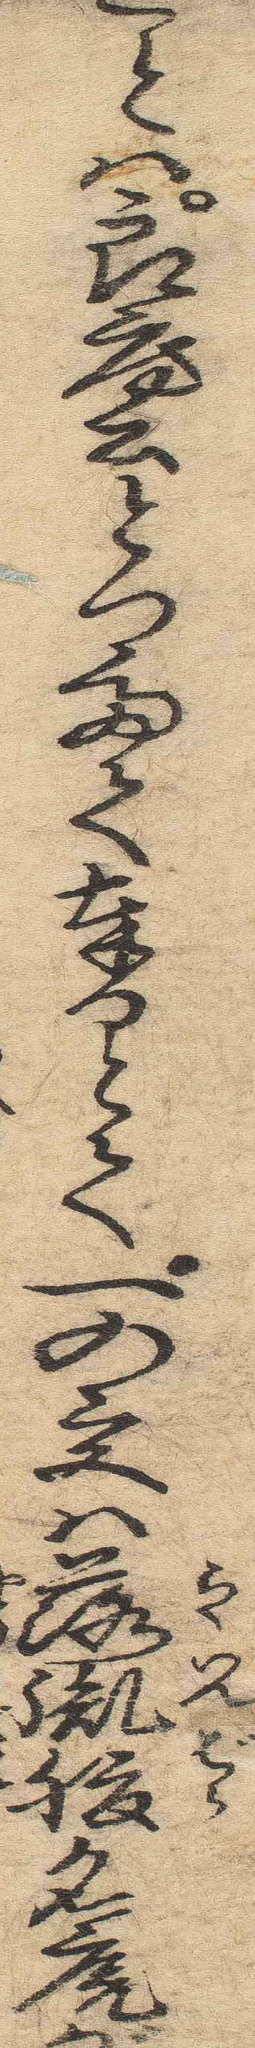ことは。良房公とりたて奉るとて。一宮は落胤腹名虎が
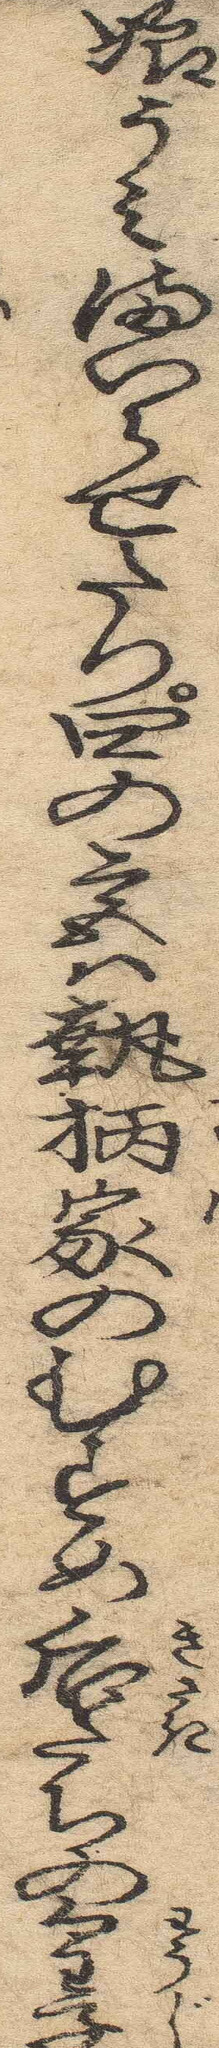娘うみまいらせたり。四の宮は執柄家のむすめ妃たちの皇子
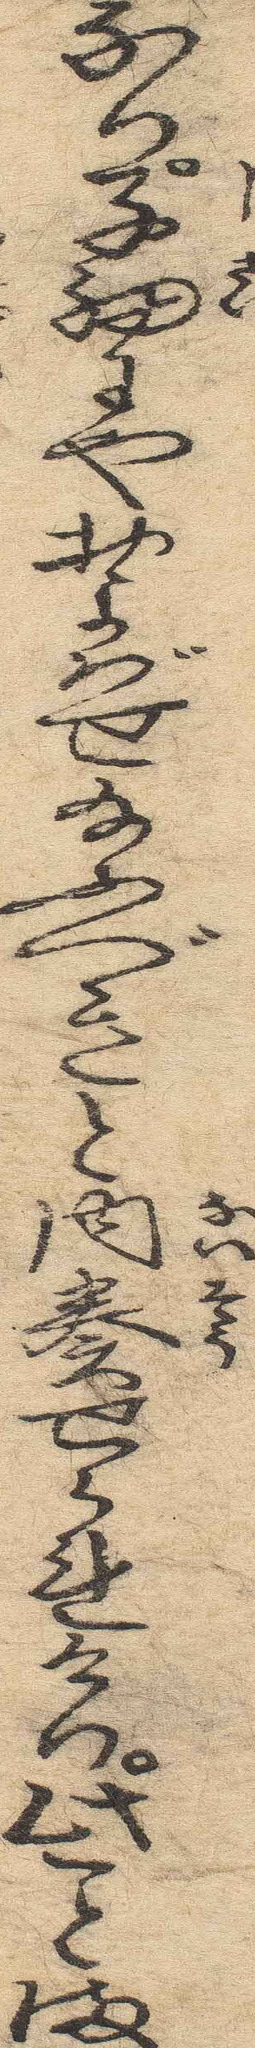なり。子細にやおよばせ給ふべきと内奏せられけり。此ことま
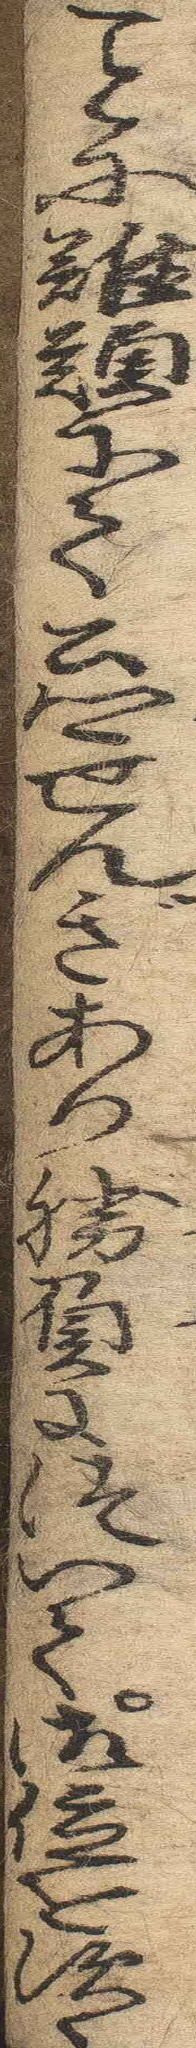ことに難題にて公卿せんぎあり。勝負について。御位を決
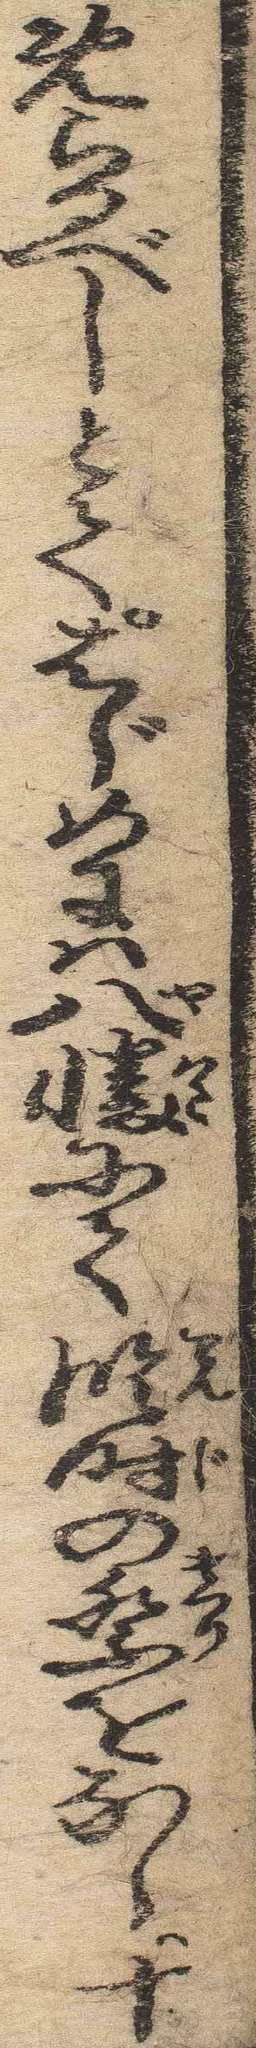めらるべしとて。はじめには八幡にて臨時の祭をなし。十
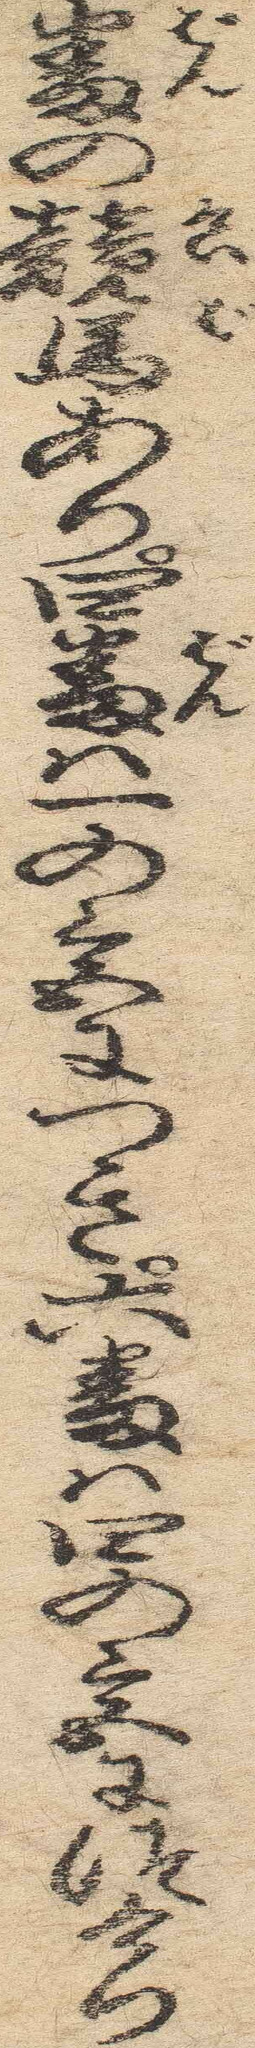番の競馬あり。四番は一の宮につき。六番は四の宮につけり
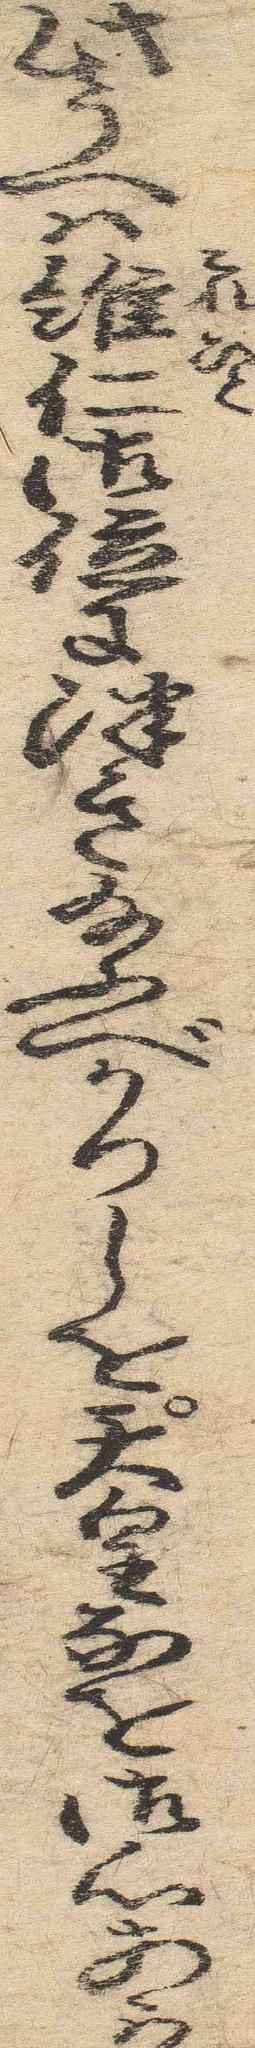此うへは惟仁御位につき給ふべかりしを。天皇なを御心あは
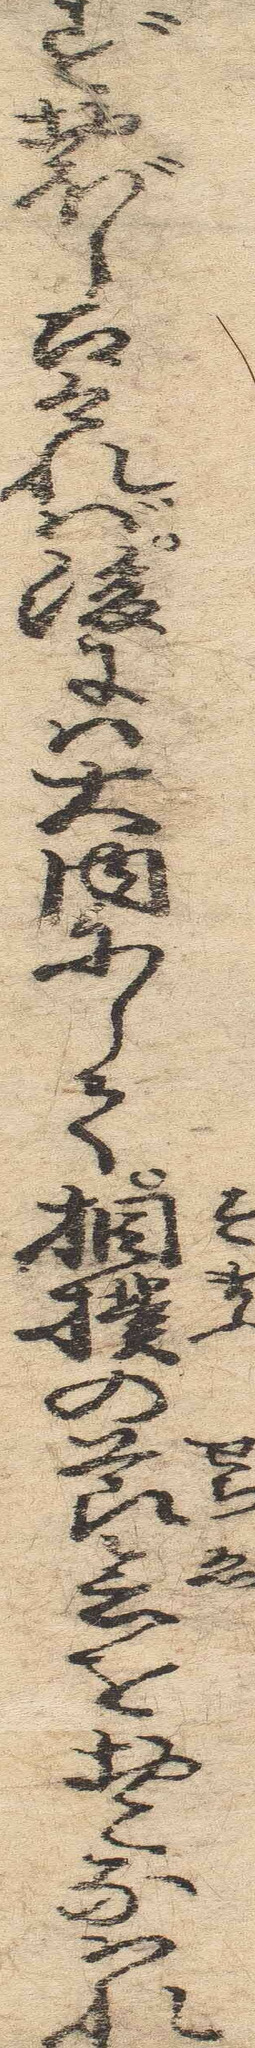ずおぼし召ければ。後には大内にして相撲の節会をおこなはれ
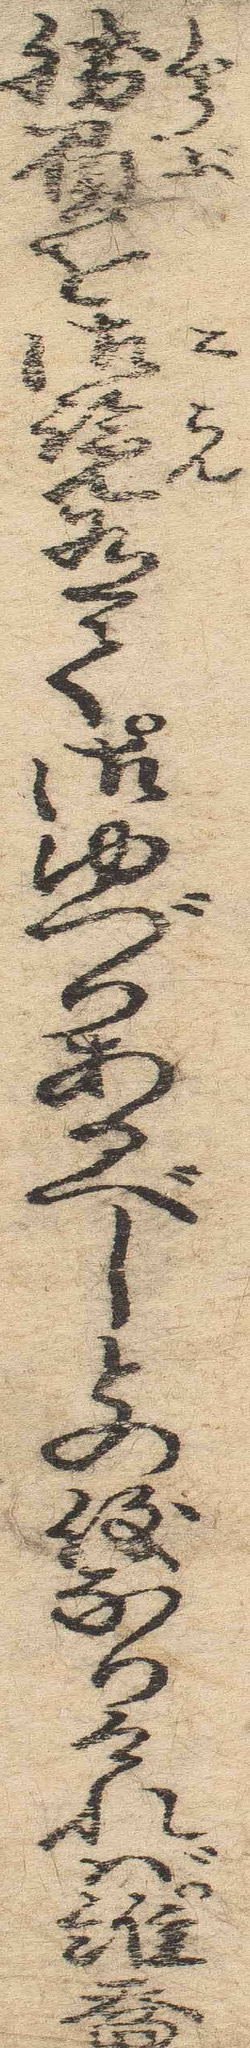勝負を御覧有て御ゆづりあるべしとの儀なりければ。惟喬
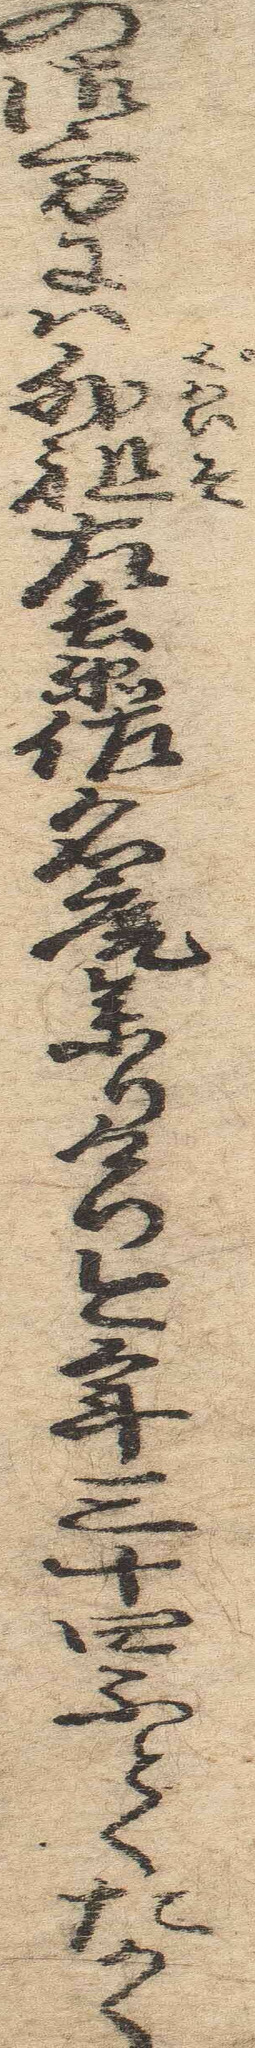の御方には外祖左兵衛佐名虎参りけり今年三十四ふとくたかく
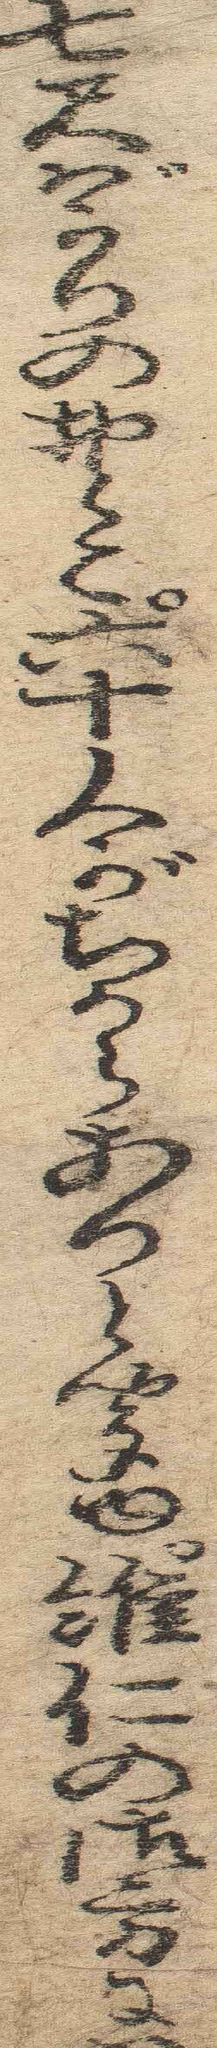七尺ばかりのおとこ。六十人がちからありし聞ゆ。惟仁の御方には
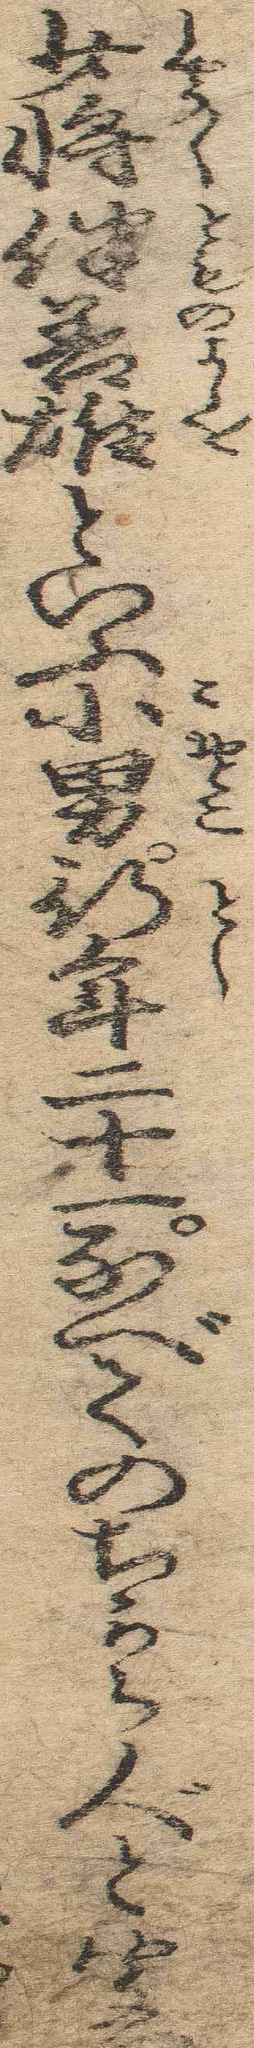少将伴善雄といふ小男。行年二十一。なべてのちから人と聞ゆ
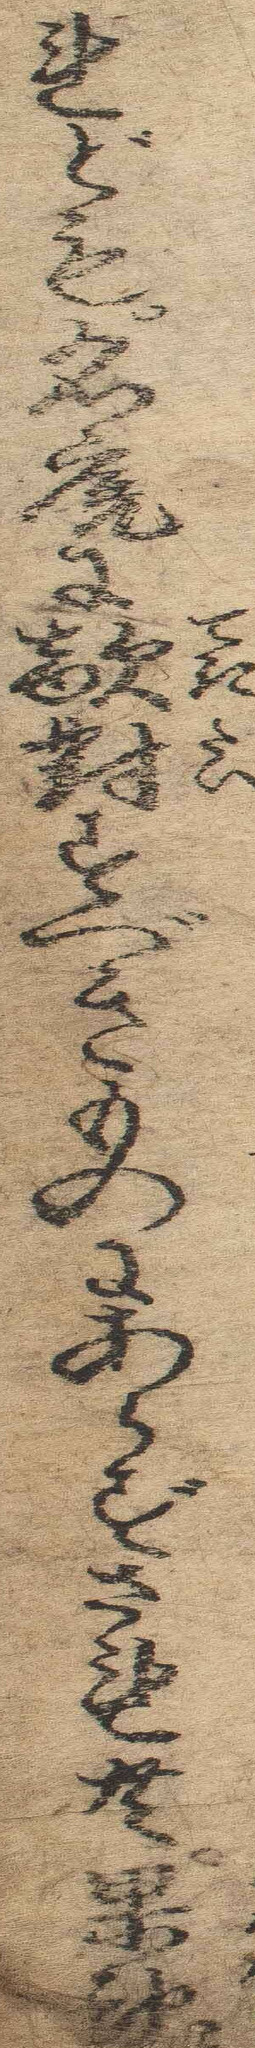れども。名虎に敵対すべきものにあらずされ共。果報

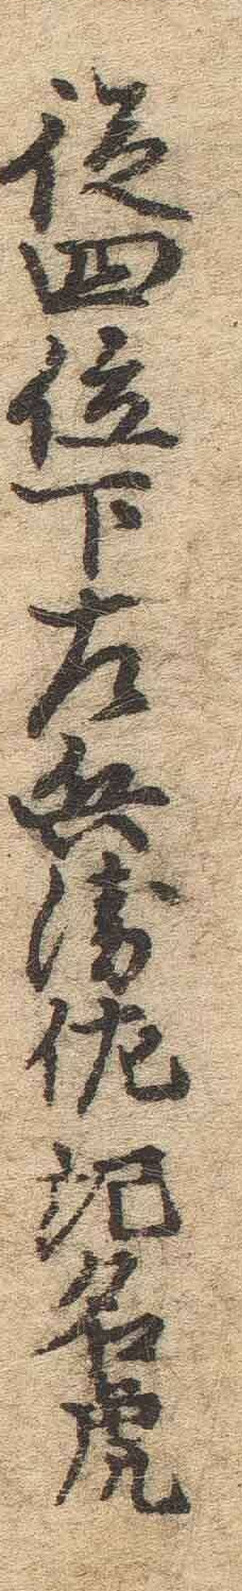従四位下左兵衛紀名虎
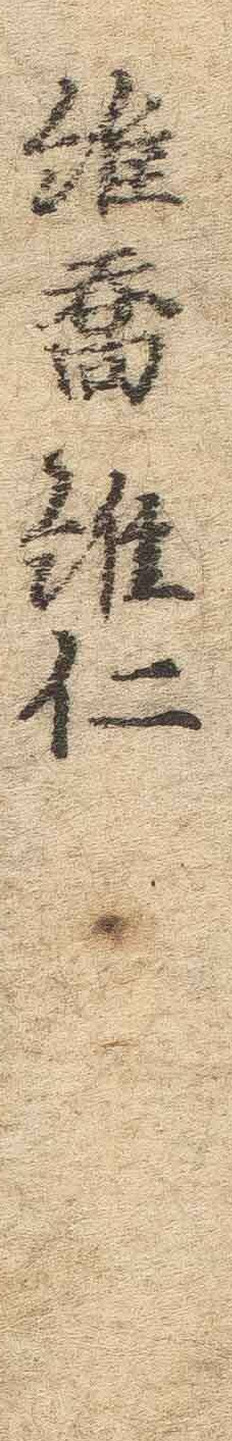維喬維仁
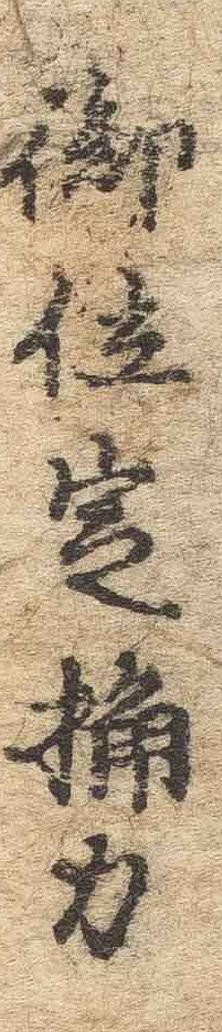御位定捔力
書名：古今相撲大全
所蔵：東京学芸大学附属図書館 国文学研究資料館
